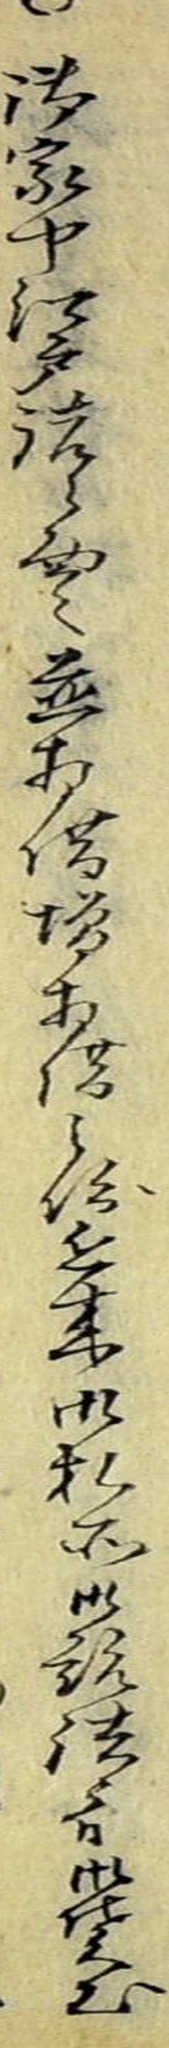○御家中江戸詰之面々並拝借増拝借之儀近来御札所御趣法に付御貸出
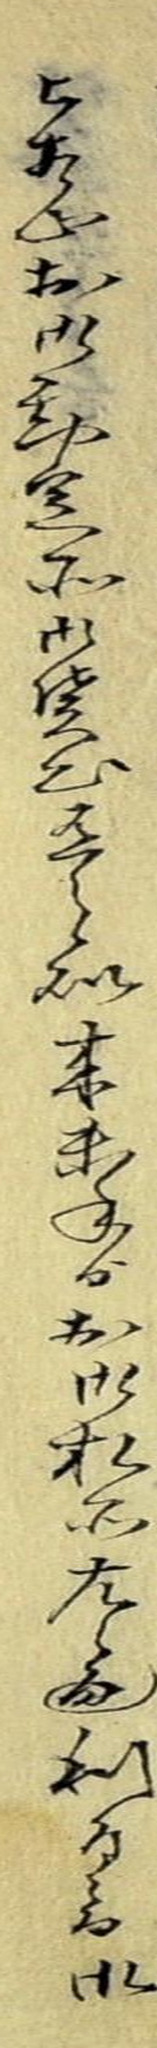被相止於御勘定所御貸出有之候処来未年ゟ於御札所左之通利付に而御

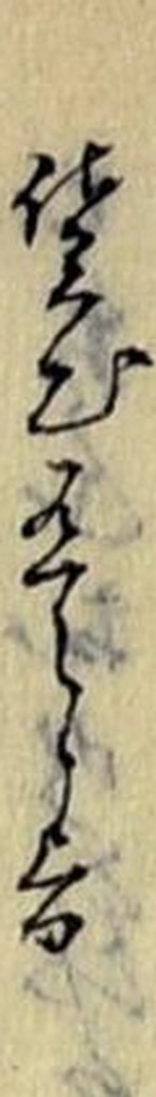貸出有之旨
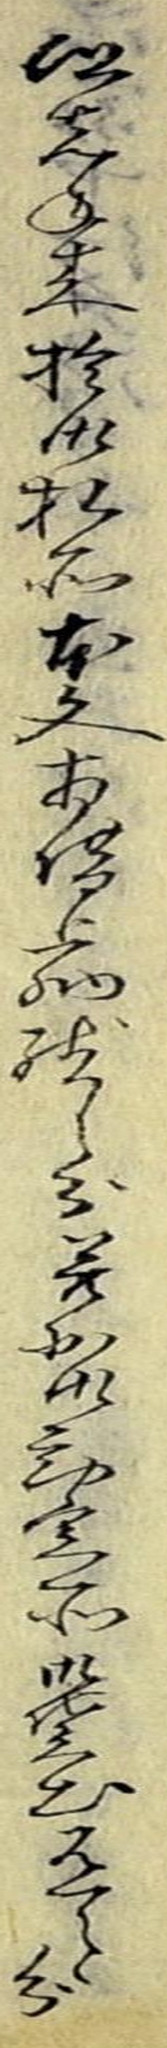但先年來於御札所本文拝借上納致候分并於御勘定所御貸出有之分
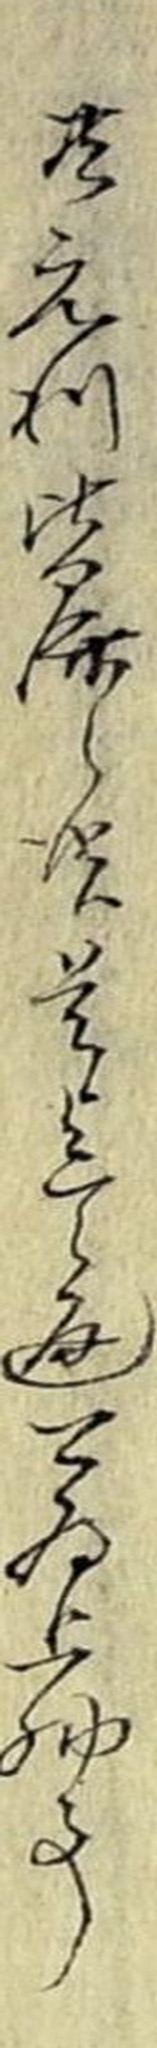共元利皆済之儀は是迄之通可為上納事
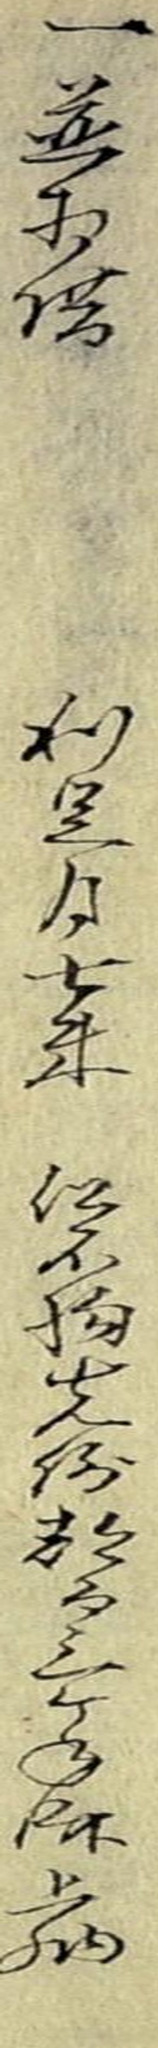一並拝借利足月七朱但不拘先例都而三ヶ年済上納
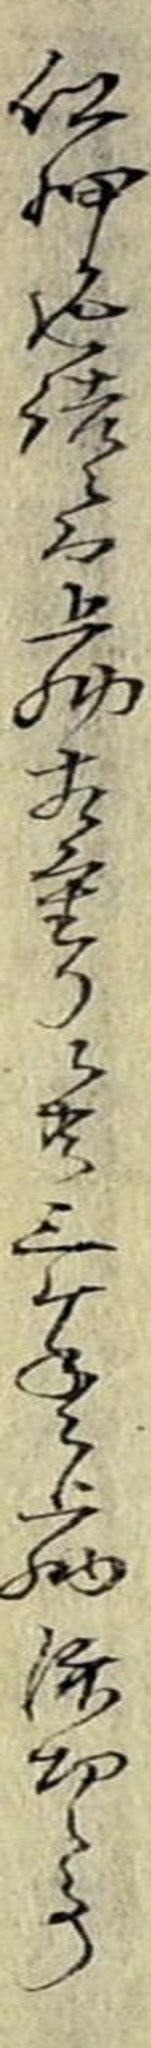但押込詰に而上納相重り候共三ヶ年之上納済切之事
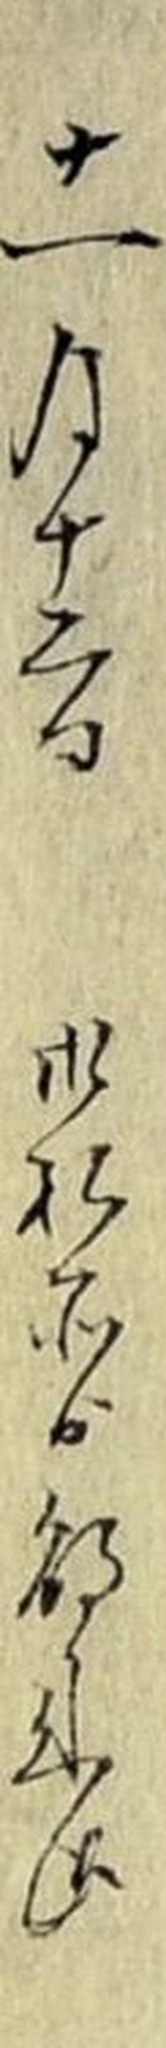十一月十二日御札所ゟ触来趣
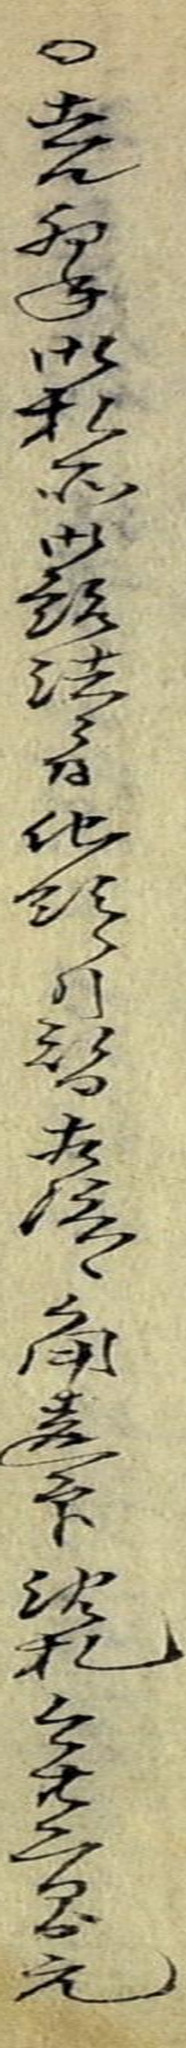○去ル卯年御札所御趣法に付他領引替相渡候角違印銀札今廿二日ゟ元
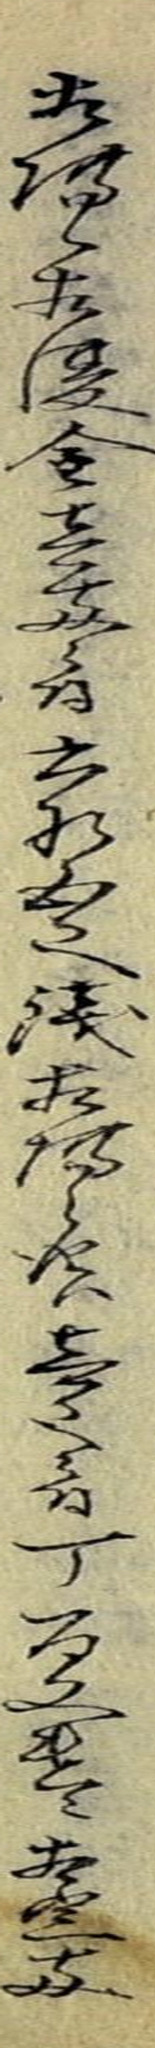相場へ相復金壱両に付六拾五匁銭相場之儀は壱匁に付丁百文遣に相定両
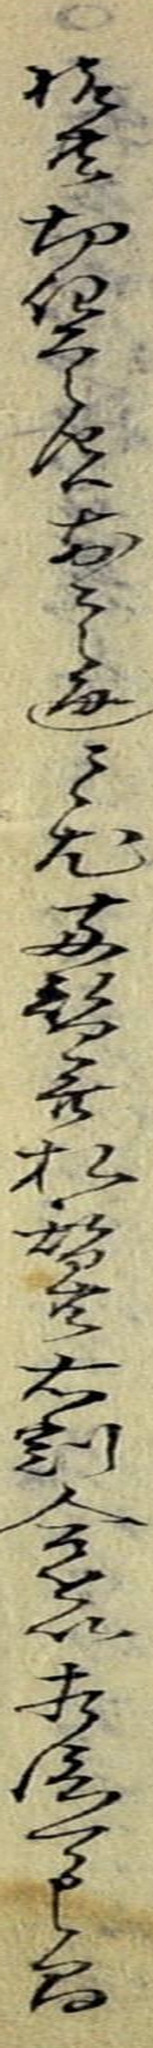様共切賃之儀は前々之通に候尤両替并札替共右割合を以相渡可申候間
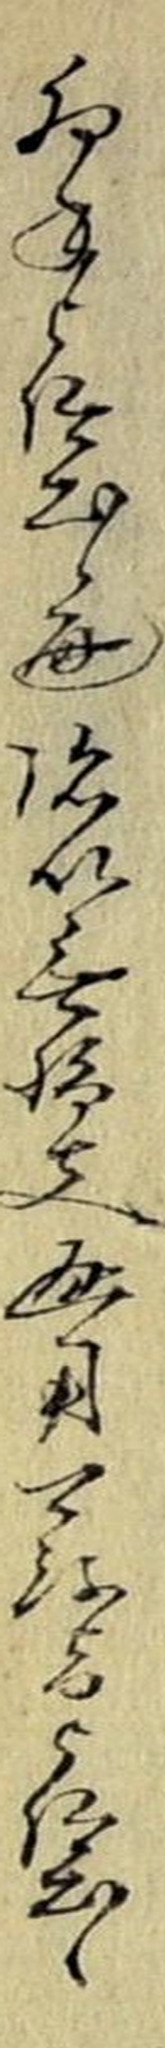卯年被仰出候通弥以無差支通用可致旨被仰出候
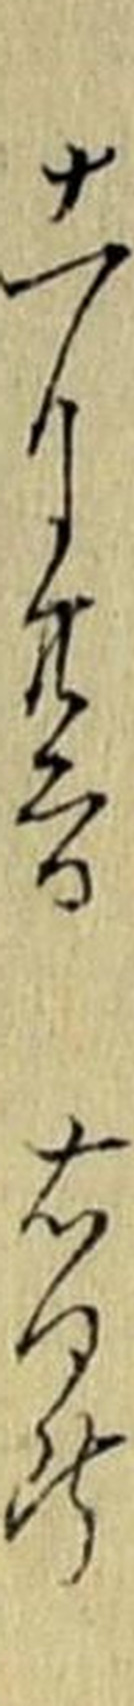十一月廿二日右同断
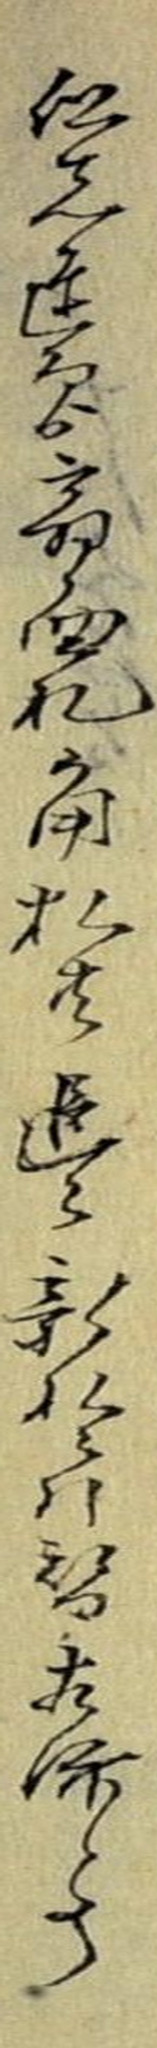但先達而ゟ扇面札角札共追々新札に引替相済候事
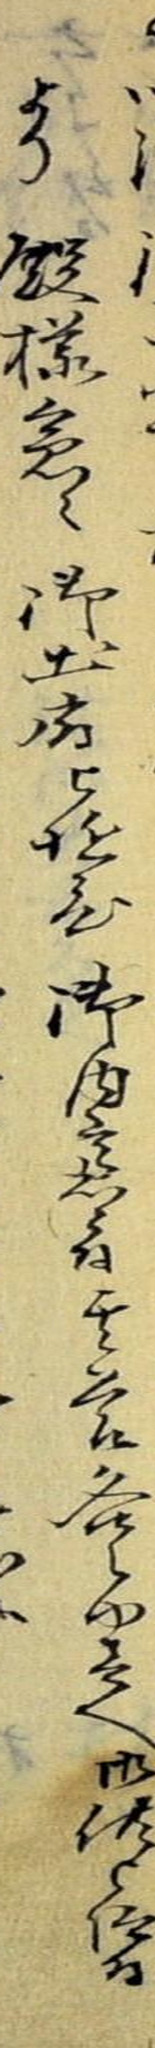より殿様兼々御出府被遊度御内慮に付其節各之内壱人御供被仰付
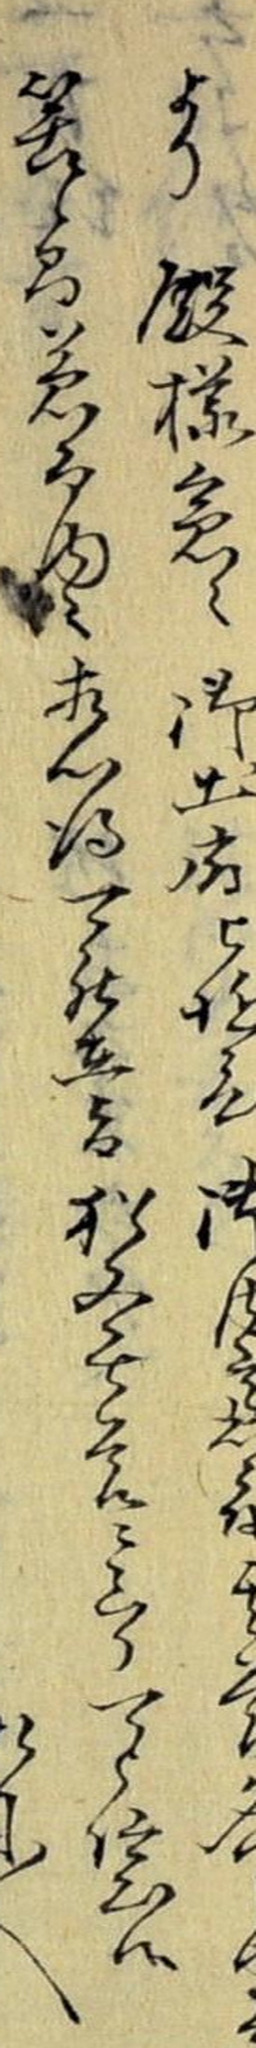筈候間兼而内々相心得可罷在旨猶又其節に至り可被仰出候
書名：命令之部 六
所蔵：福井県文書館 Fukui Prefectural Archives
